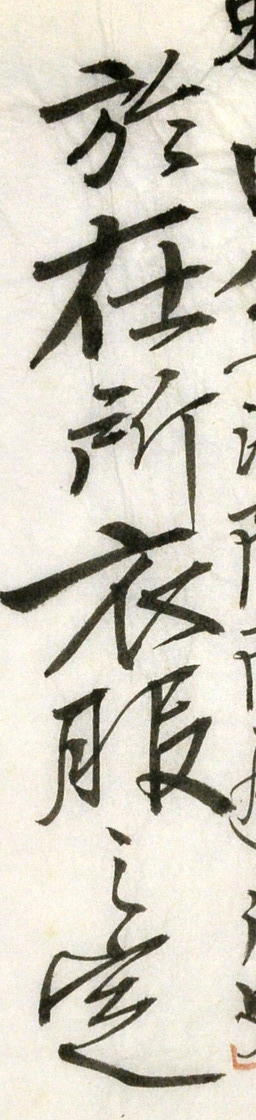於在所衣服之定
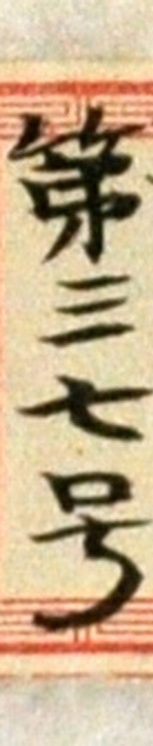第三七号

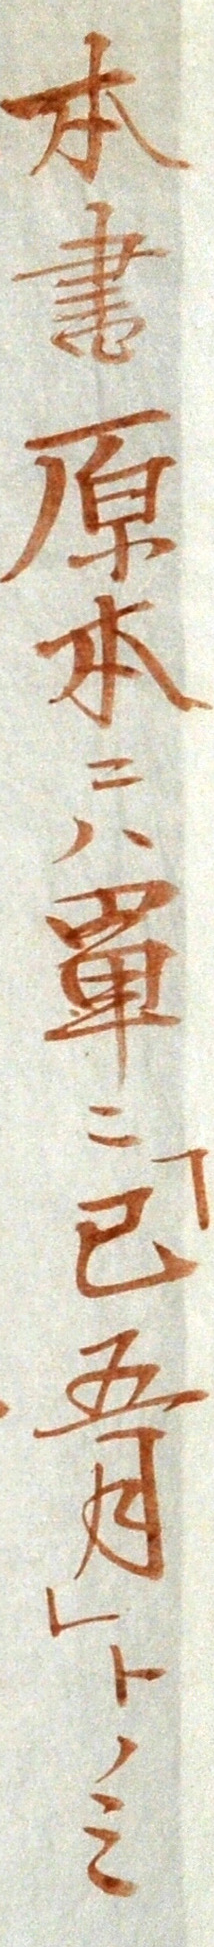本書原本ニハ単ニ「巳五月」トノミ
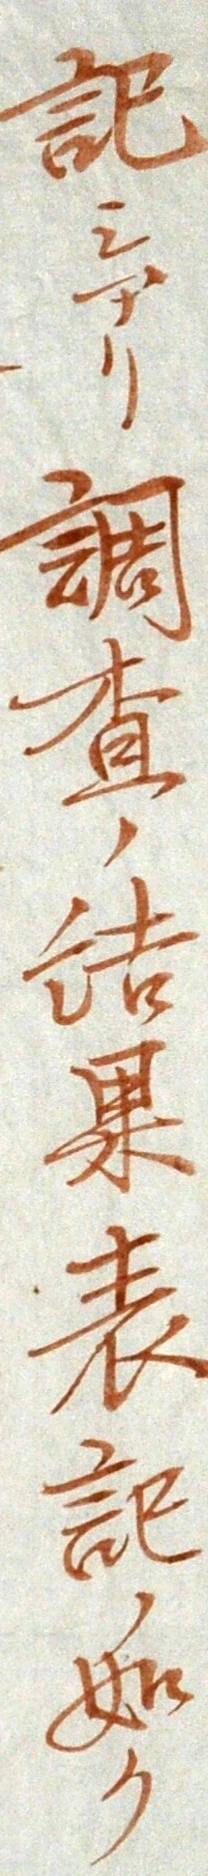記シアリ調査ノ結果表記ノ如ク
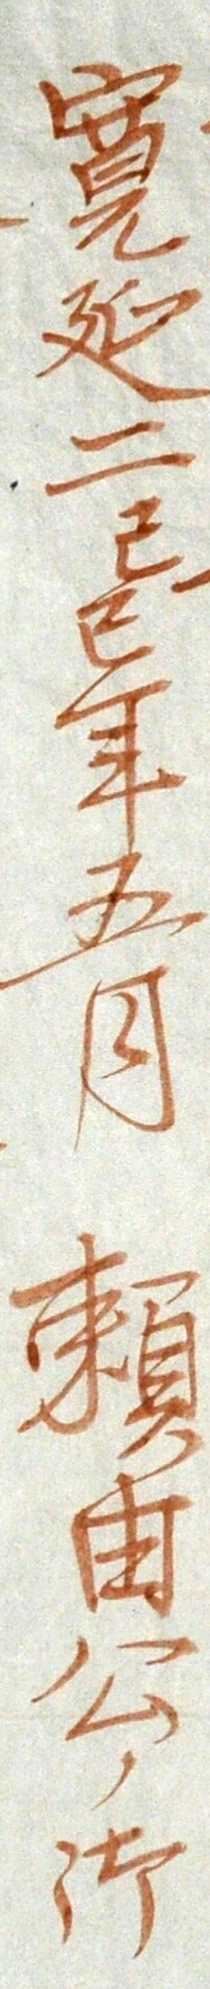寛延二己巳年五月頼由公ノ御
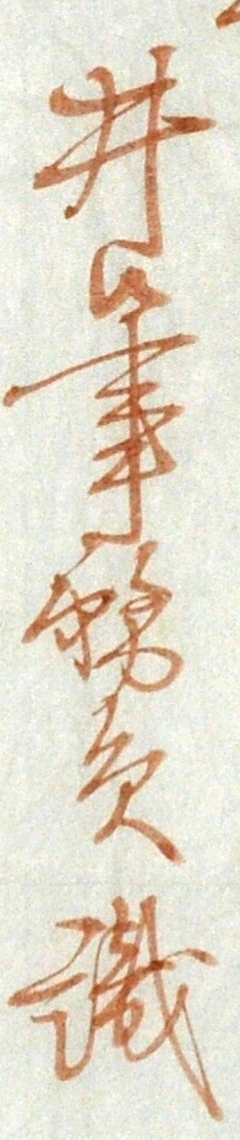井口事務員識
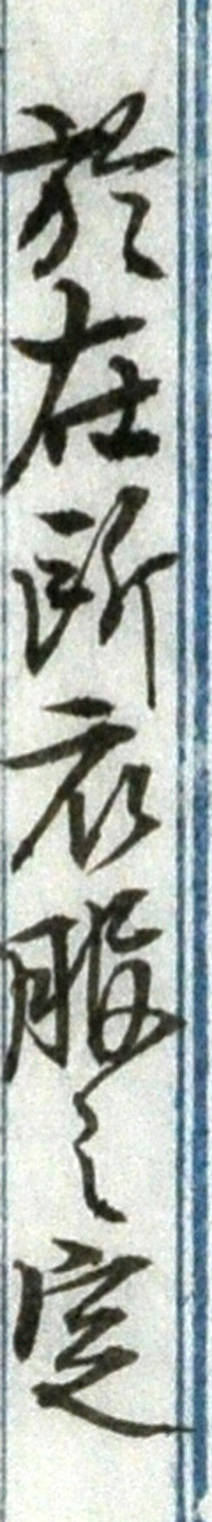於在所衣服之定
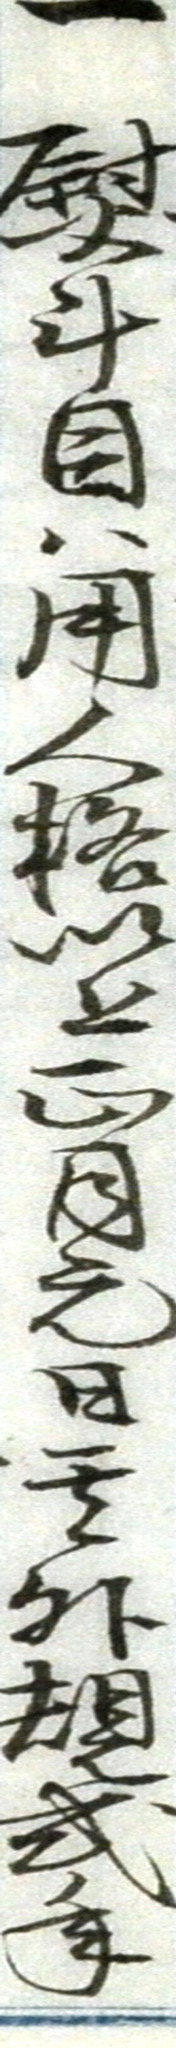一熨斗目ハ用人格以上正月元日其外規式年
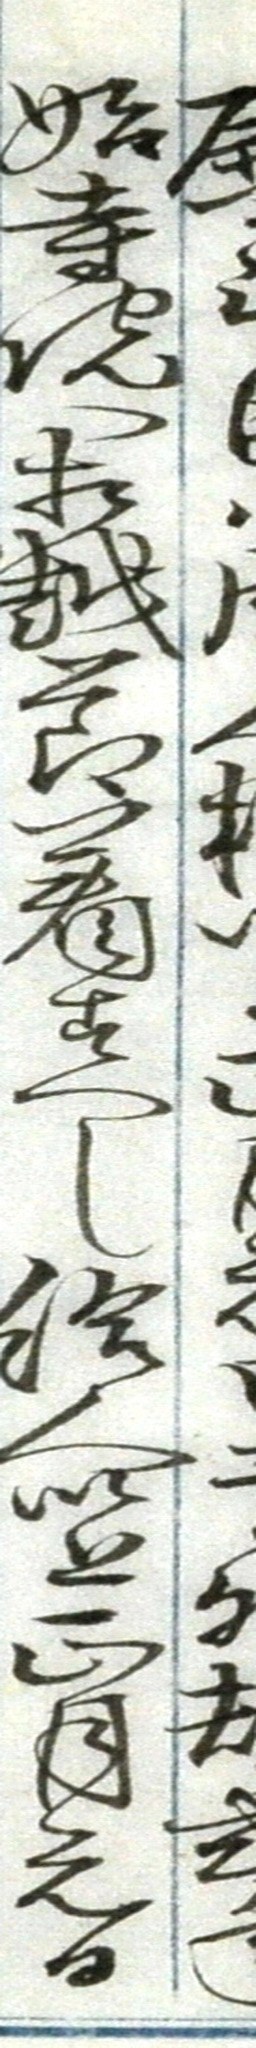始寺院へ相越節着すへし給人以上正月元日
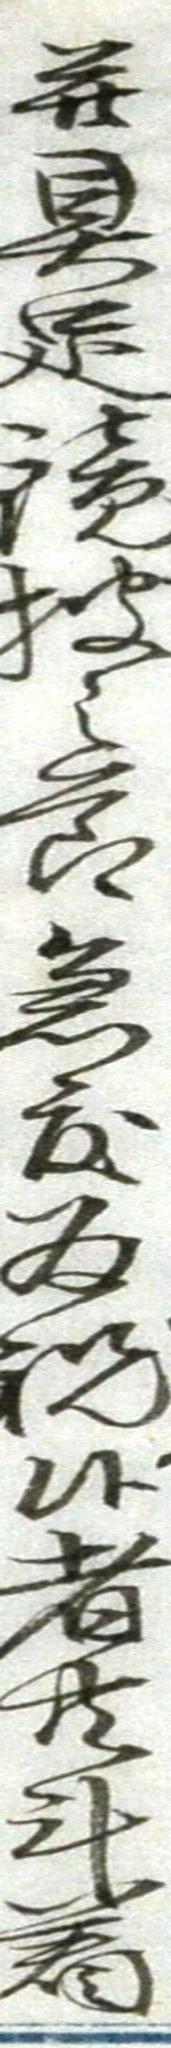并具足鏡披之節急度為祝候者共斗着
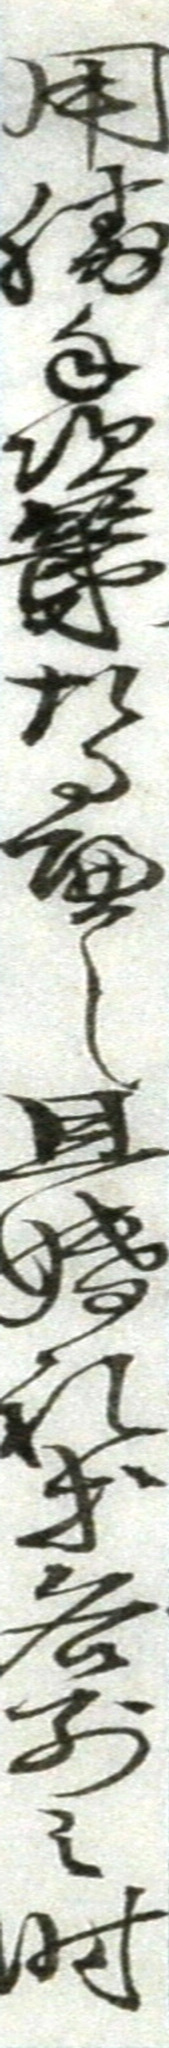用勝手次第たるへし且婚礼等各別之時
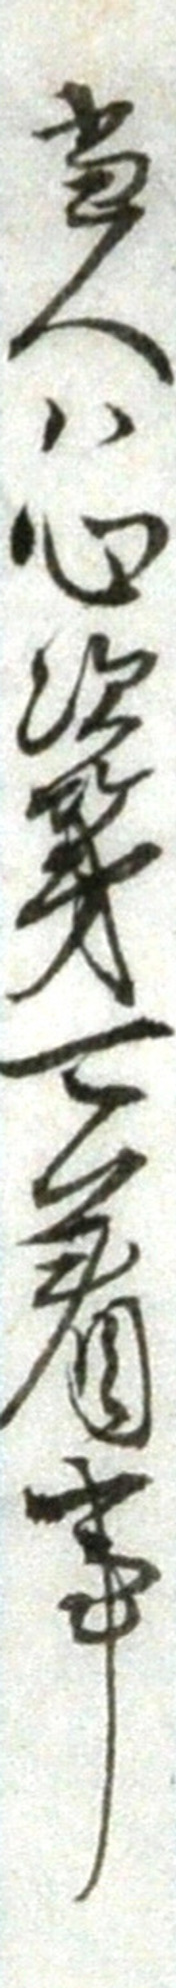当人ハ心次第可着事
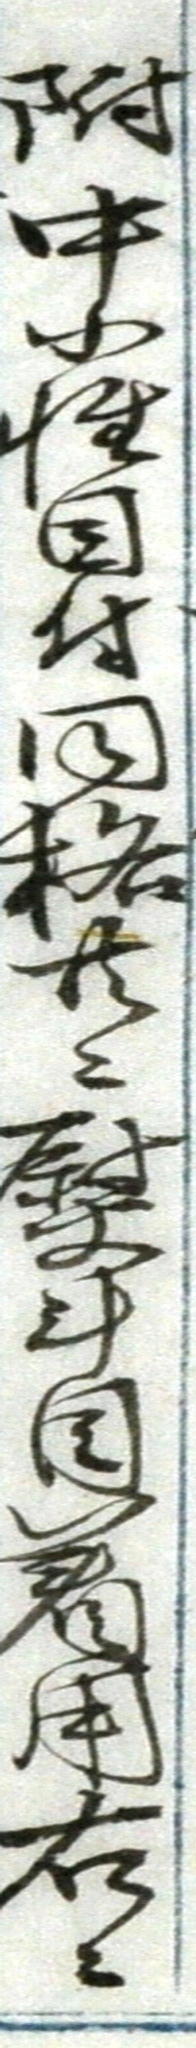附中小性目付同格共ニ熨斗目着用右ニ
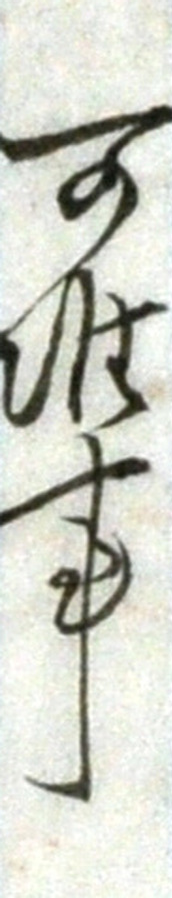可准事
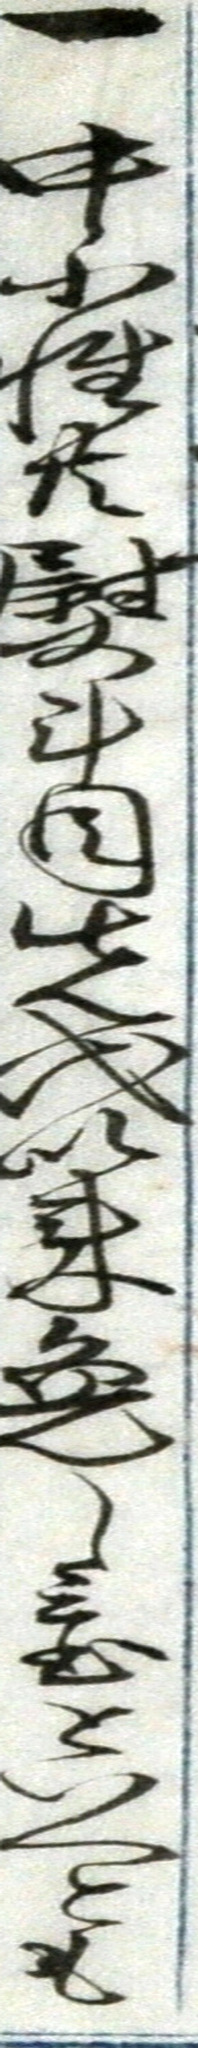一中小性共熨斗目先代以来免し置といへとも
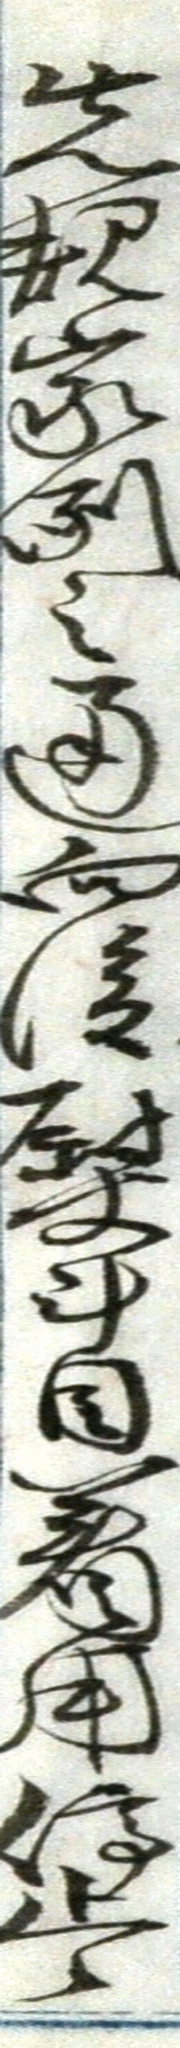先規家例之通向後熨斗目着用停止ノ
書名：頼由公（源隆院殿）御定
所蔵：伊那市立高遠町図書館・合同会社AMANE
